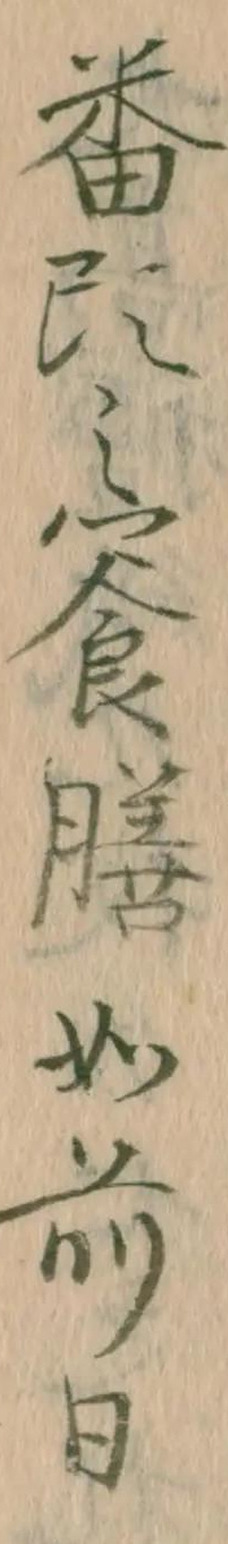一番頭之饗膳如前日
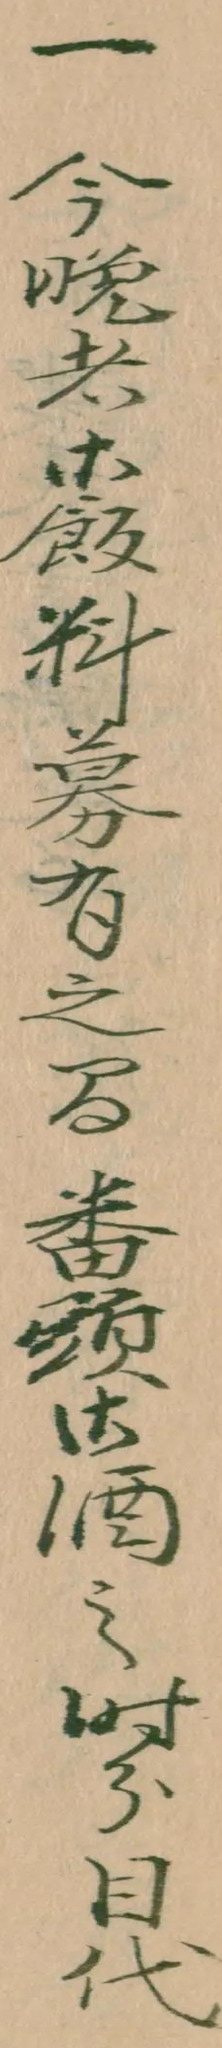一今晩は御飯料募有之間番頭御酒之時分目代
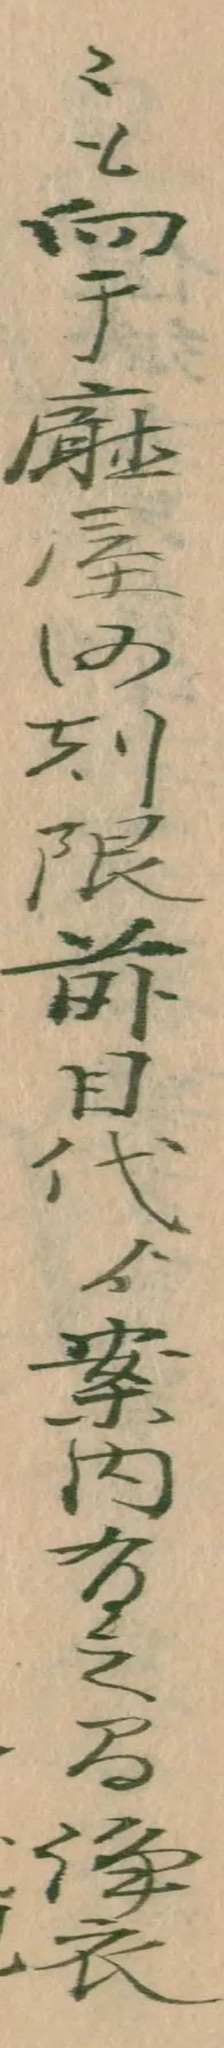々も向于庁屋何刻限前目代ゟ案内有之間浄衣
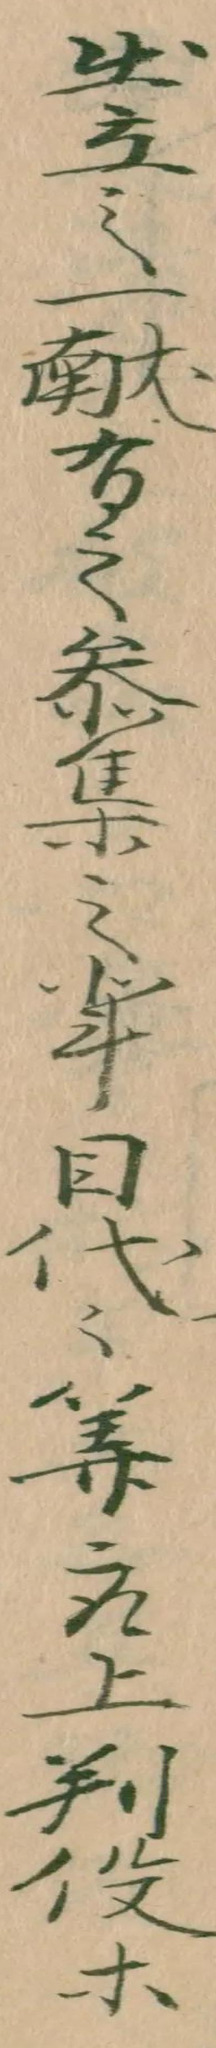出立之一献有之参集之輩目代々等取上判役等
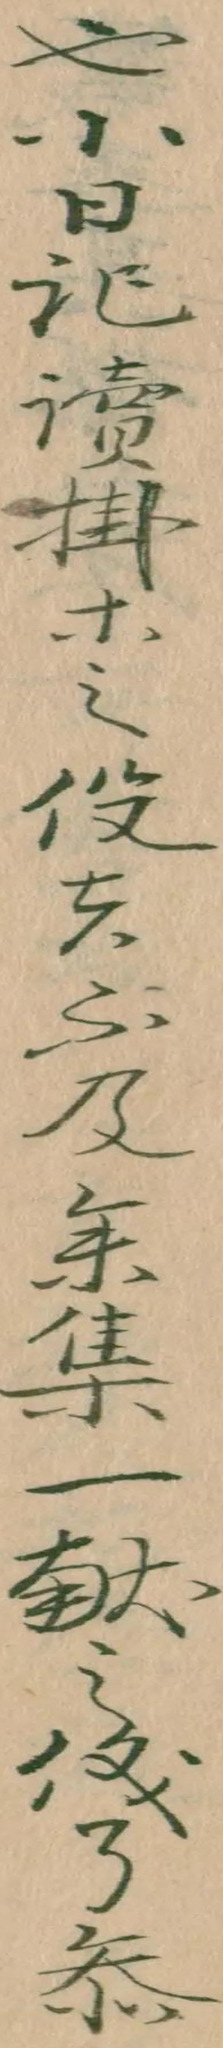也小日記読掛等之役は不及参集一献之儀了参
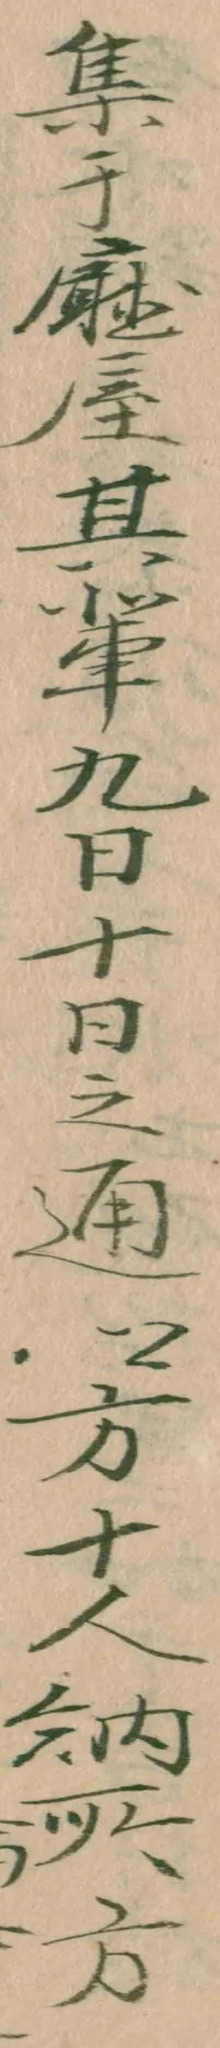集于庁屋其輩九日十日之通郷方十人納所方

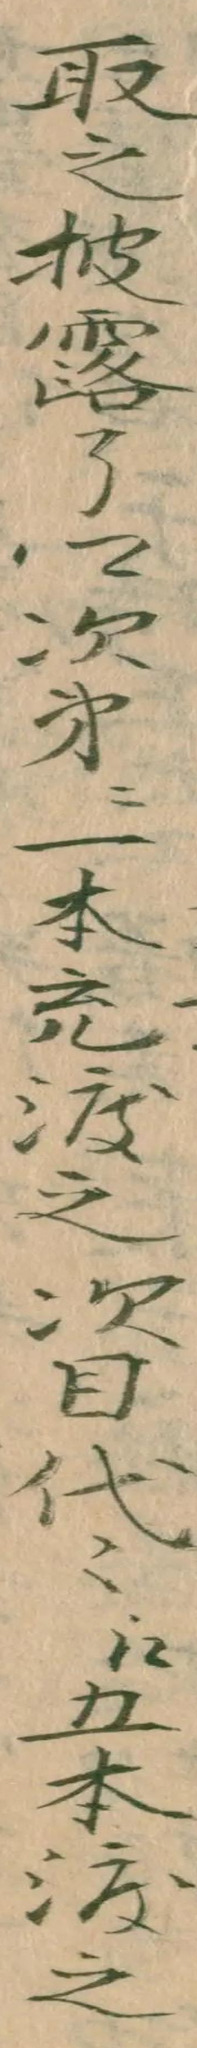取之披露了郷次第ニ一本充渡之次日代々え五本渡之
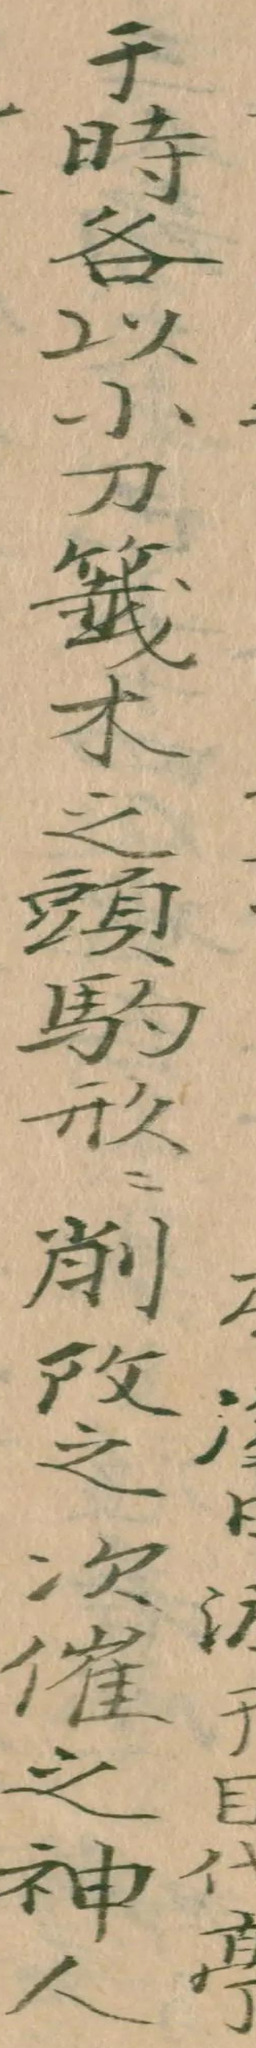于時各以小刀籤木之頭駒形ニ削改之次催之神人
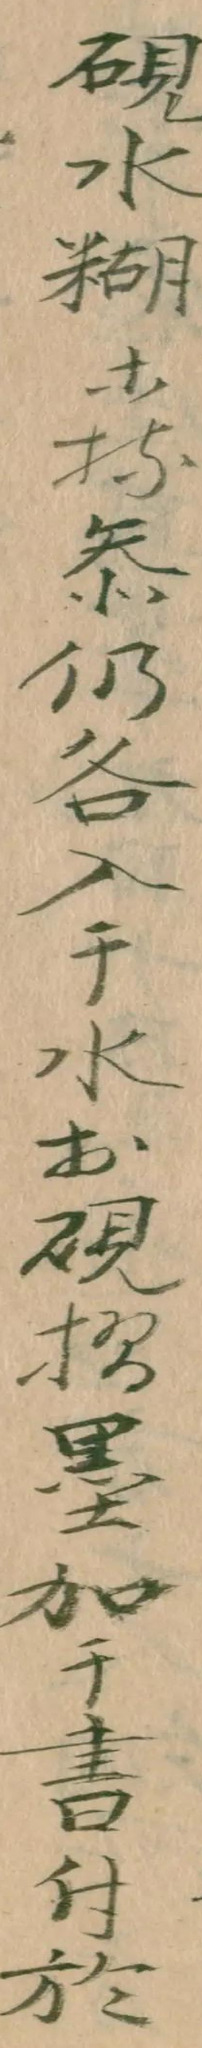硯水糊等持参仍各入干水於硯摺墨加于書付於
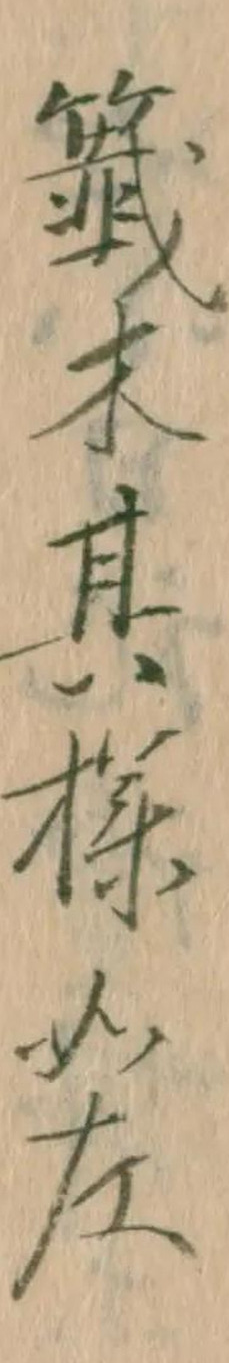籤木其様如左
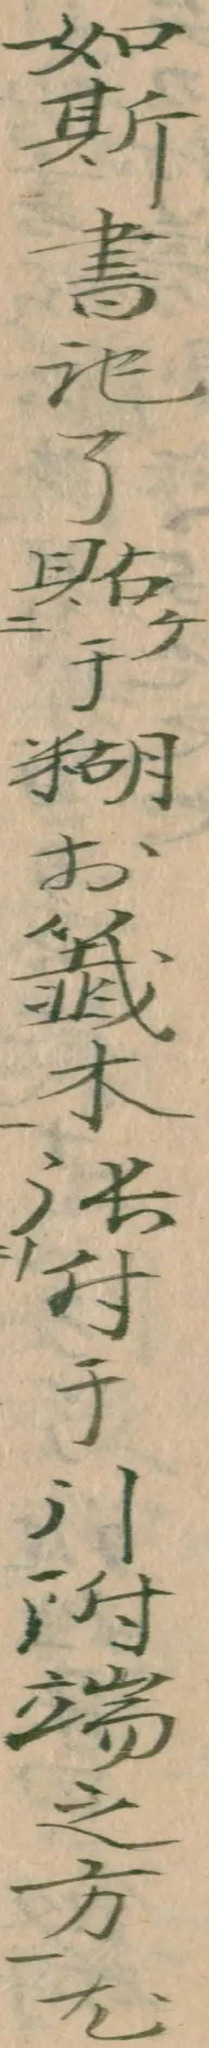如斯書記了貼ケ于糊於籖木張-付于引附端之方尤
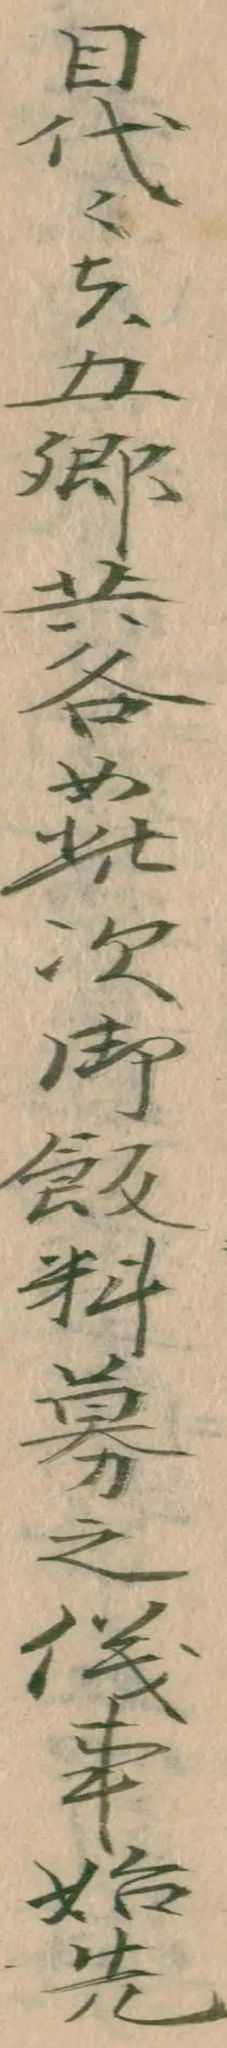目代々者五郷共各如此次御飯料募之儀事始先
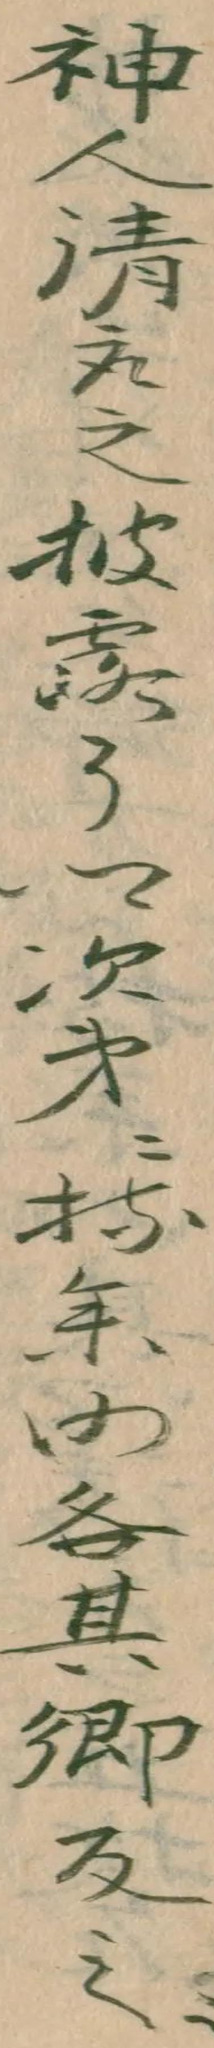神人請取之披露了郷次第ニ持参内各其郷反之
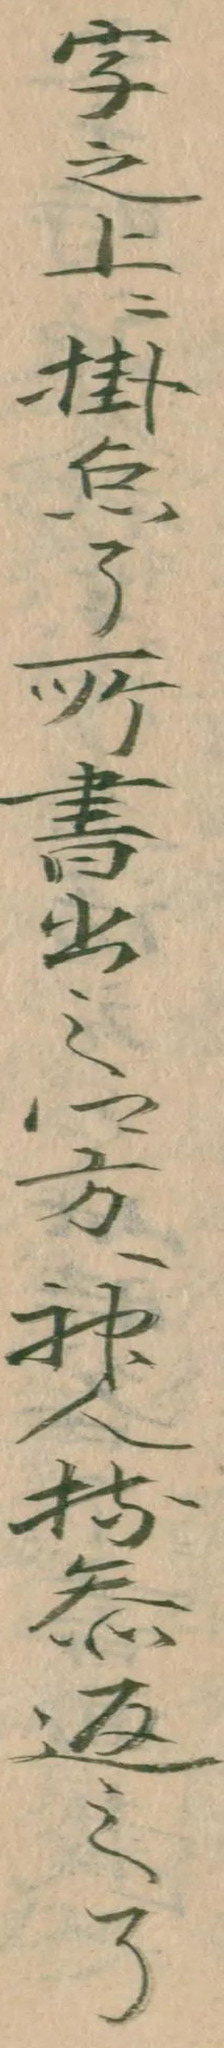字之上ニ掛点了所書出之郷方へ神人持参返之了
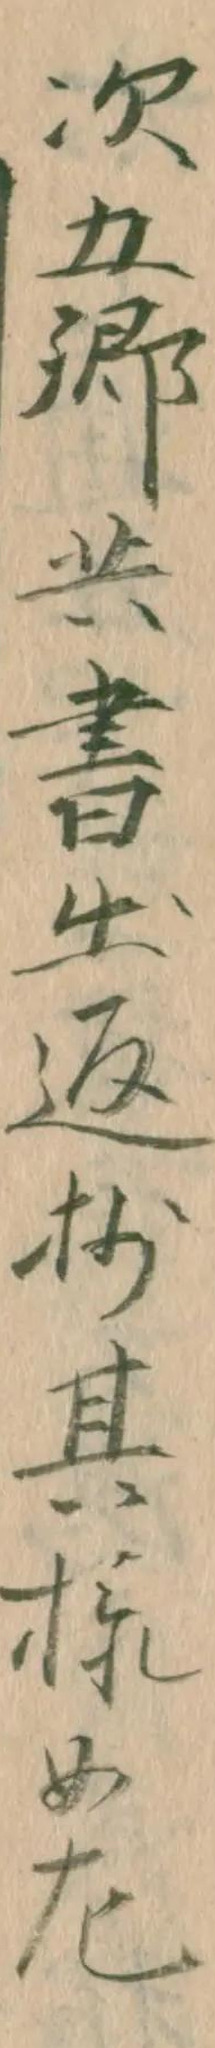次五郷共書出返抄其様如左
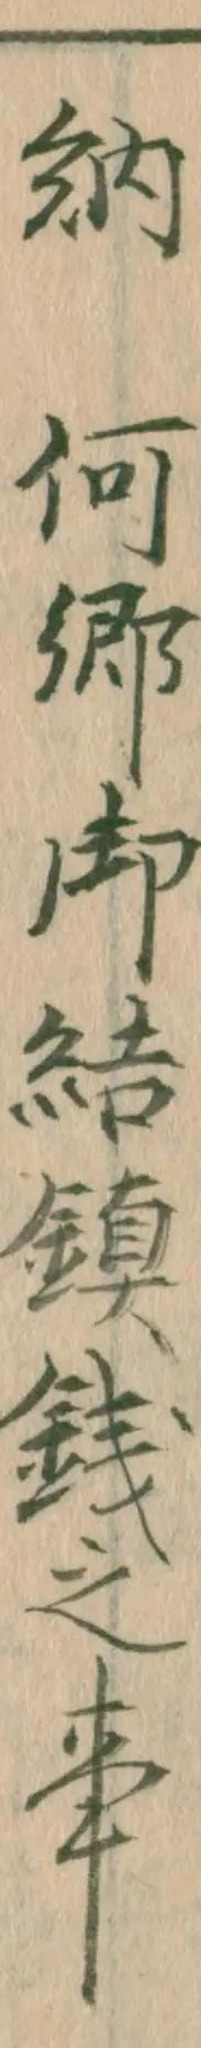納何郷御結鎮銭之事
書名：賀茂社記録. 第26冊
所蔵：国立国会図書館 National Diet Library, JAPAN
